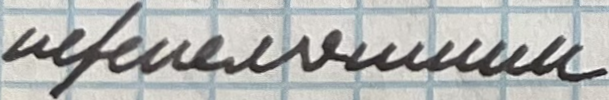перепелятник
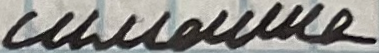сплюшка
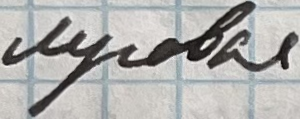луговая
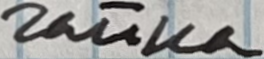чайка
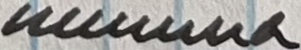питта
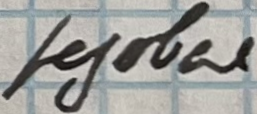розовая
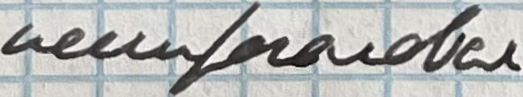пестроголовая
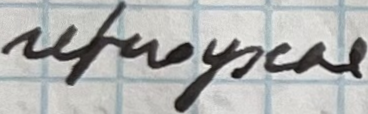черноухая
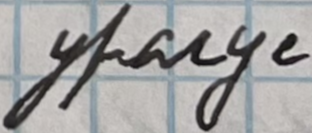урагус
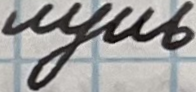лунь
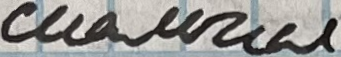скальная
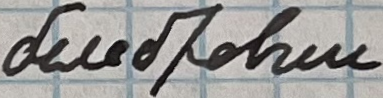белобровик
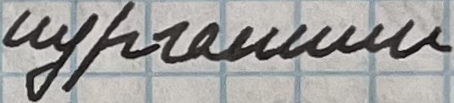курганник
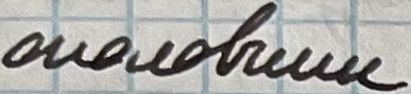ополовник
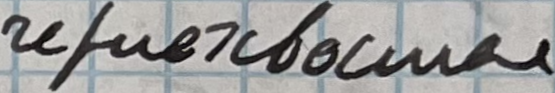чернохвостая
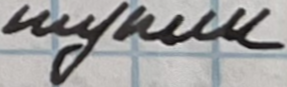тупик
